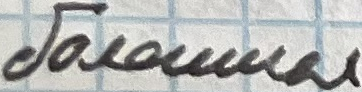болотная
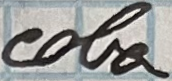сова
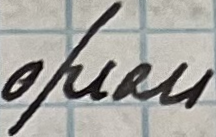орлан
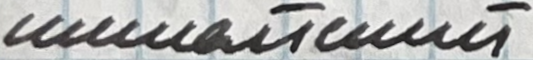китайский
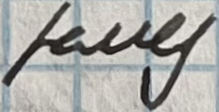ремез
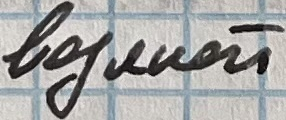водяной
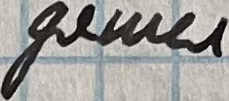дятел
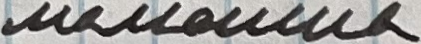малютка
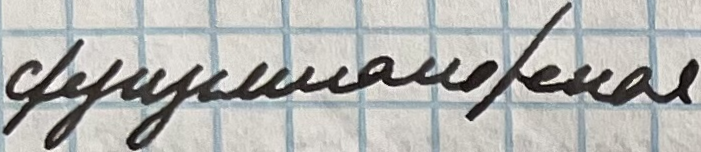средиземноморская
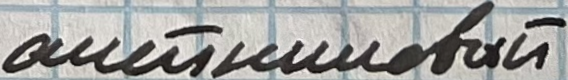ошейниковый
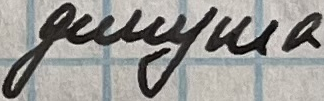дикуша
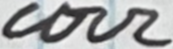сыч
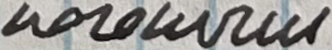погоныш
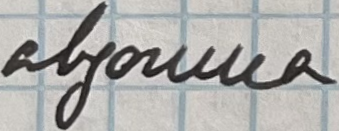авдотка
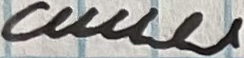синяя
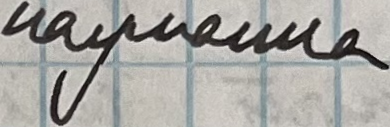науманна
